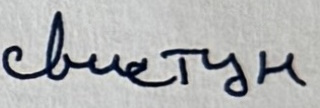свистун
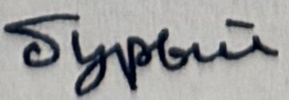бурый
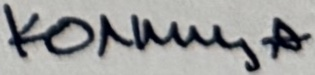колпица
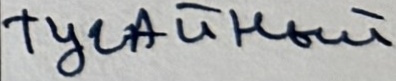тугайный
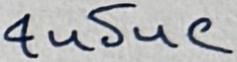чибис
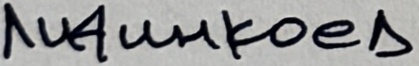личинкоед
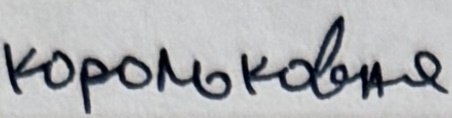корольковая
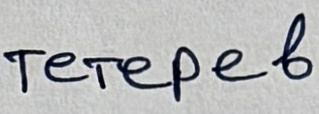тетерев
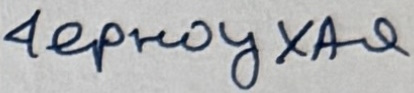черноухая
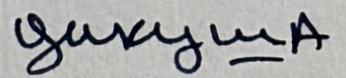дикуша
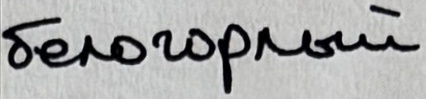белогорлый
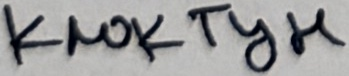клоктун
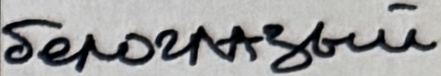белоглазый
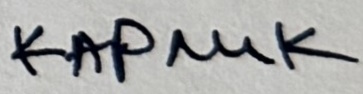карлик
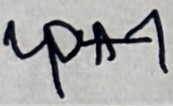грач
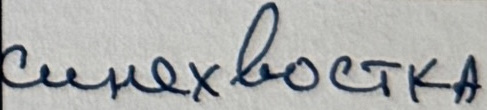синехвостка
